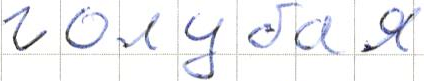голубая
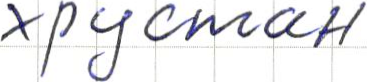хрустан
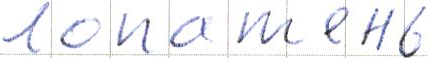лопатень
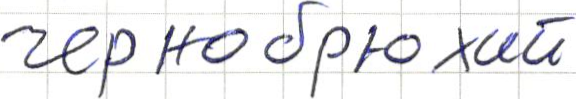чернобрюхий
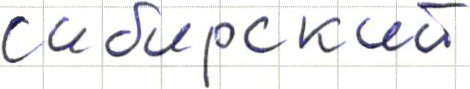сибирский
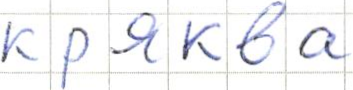кряква
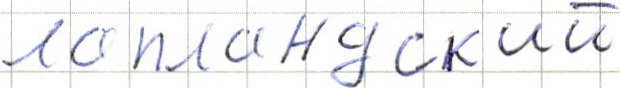лапландский
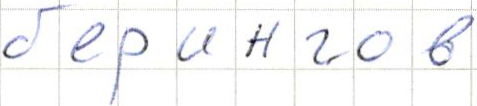берингов
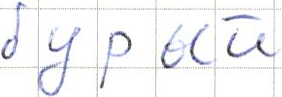бурый
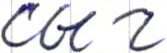сыч
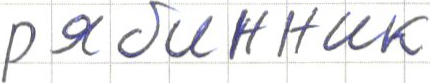рябинник
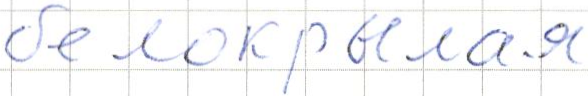белокрылая
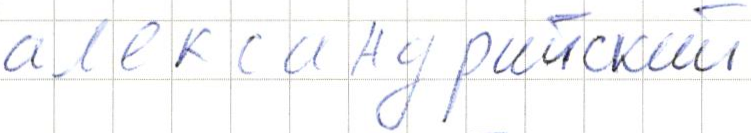александрийский
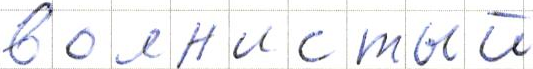волнистый
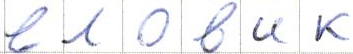еловик
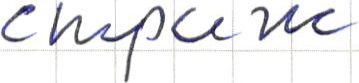стриж
